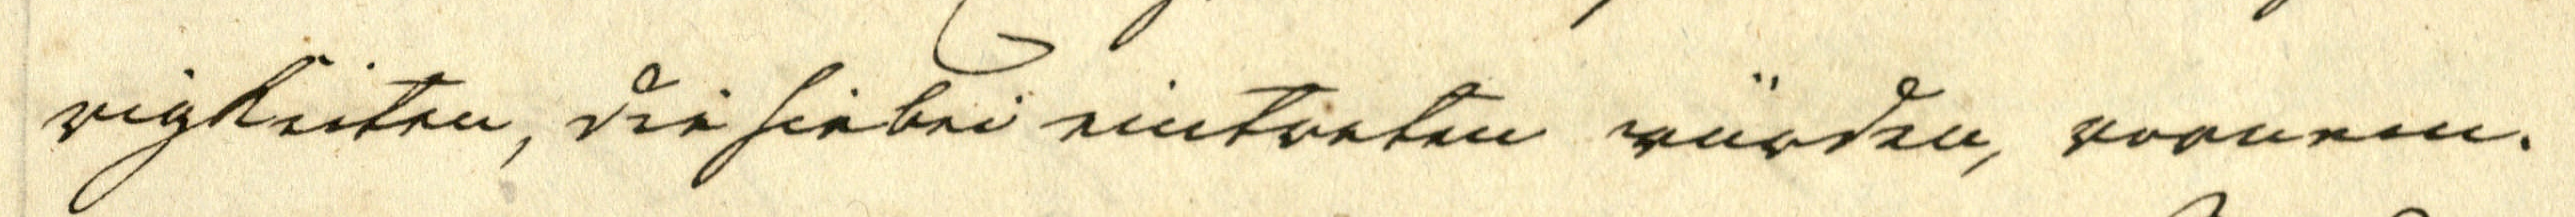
rigkeiten, die hiebei eintreten würden, vornem¬
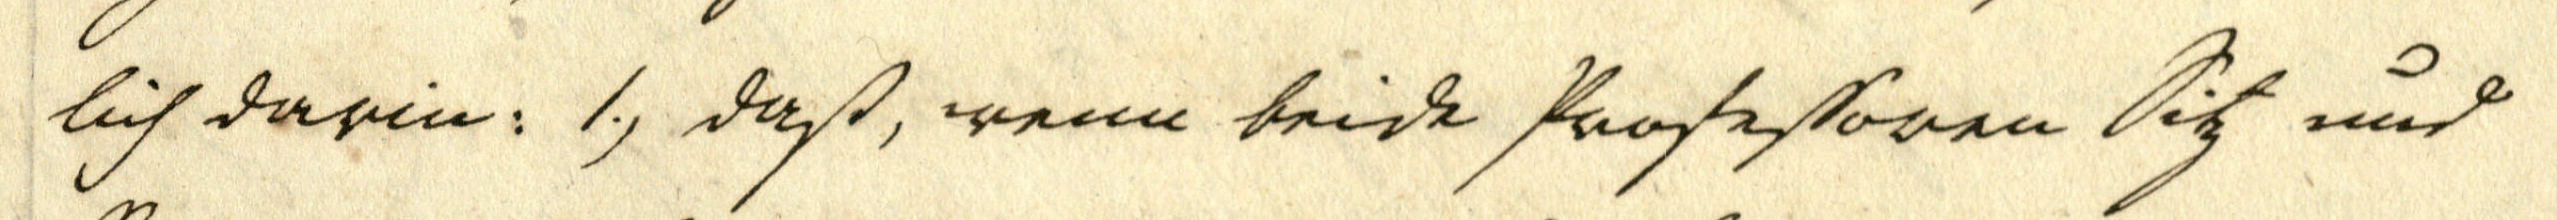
lich darin: 1., daß, wenn beide Professoren Sitz und
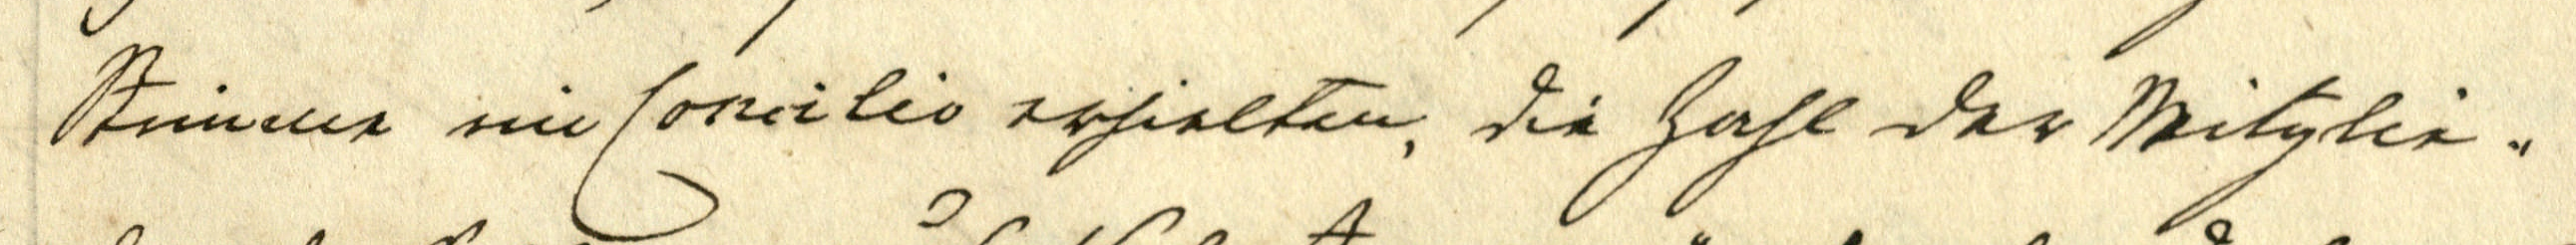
Stimme im Concilio erhielten, die Zahl der Mitglie¬
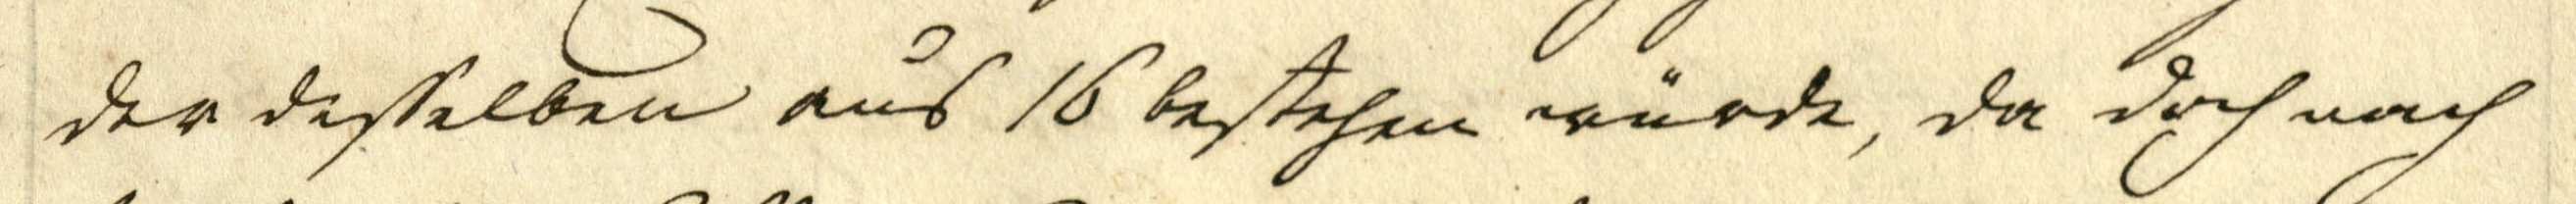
der desselben aus 16 bestehen würde, da doch nach
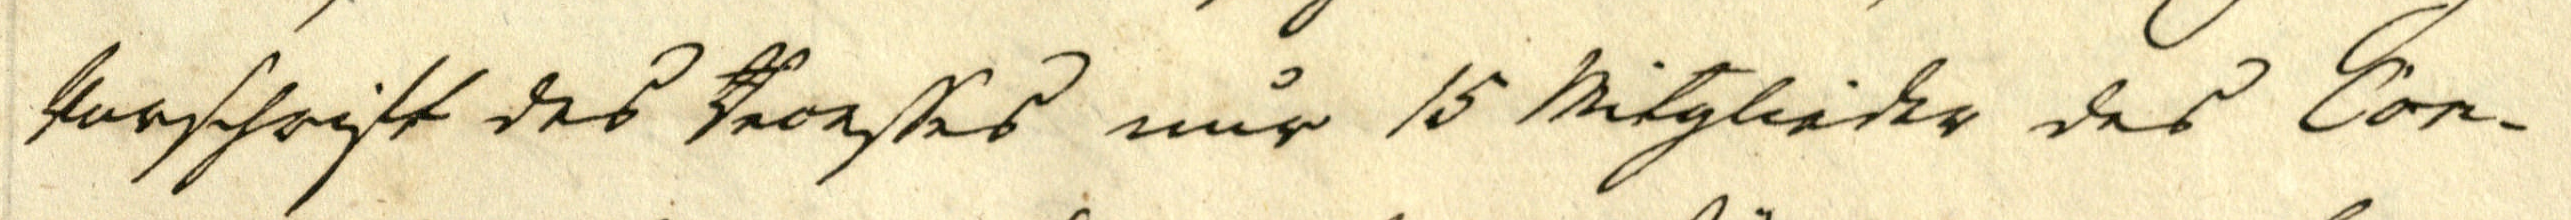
Vorschrift des Recesses nur 15 Mitglieder des Con¬
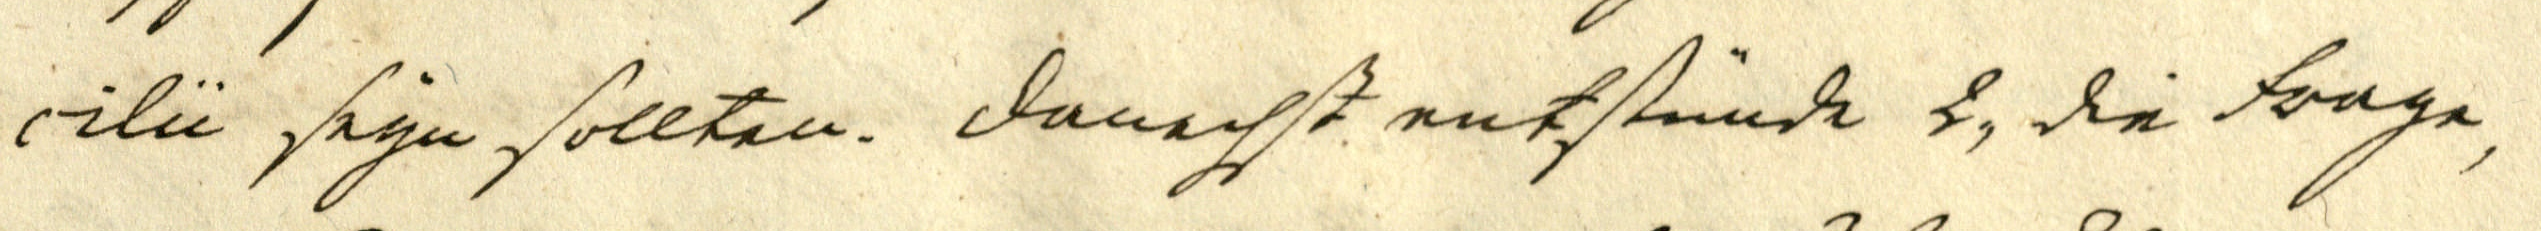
cilii seÿn sollten. Danechst entstünde 2., die Frage,
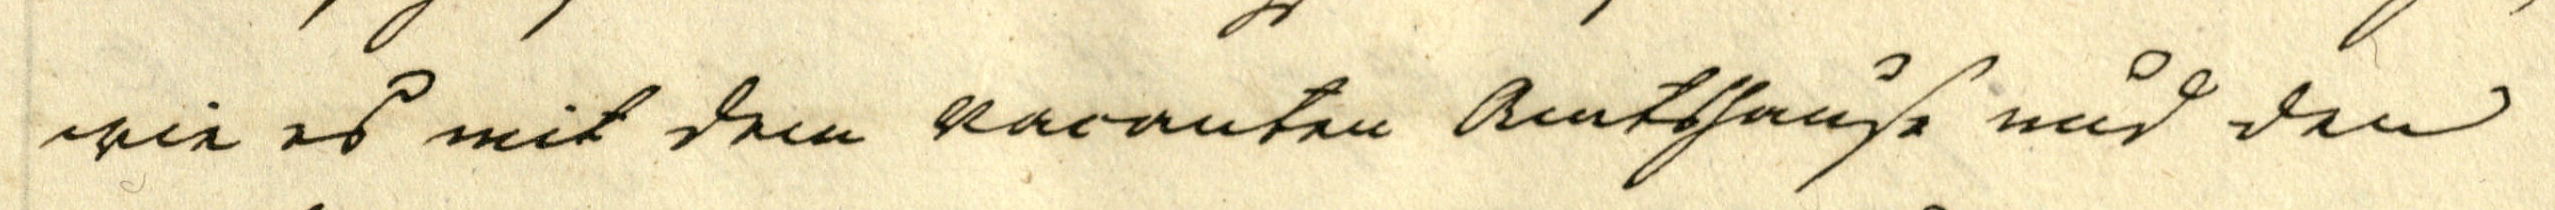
wie es mit dem vacanten Amtshause und den
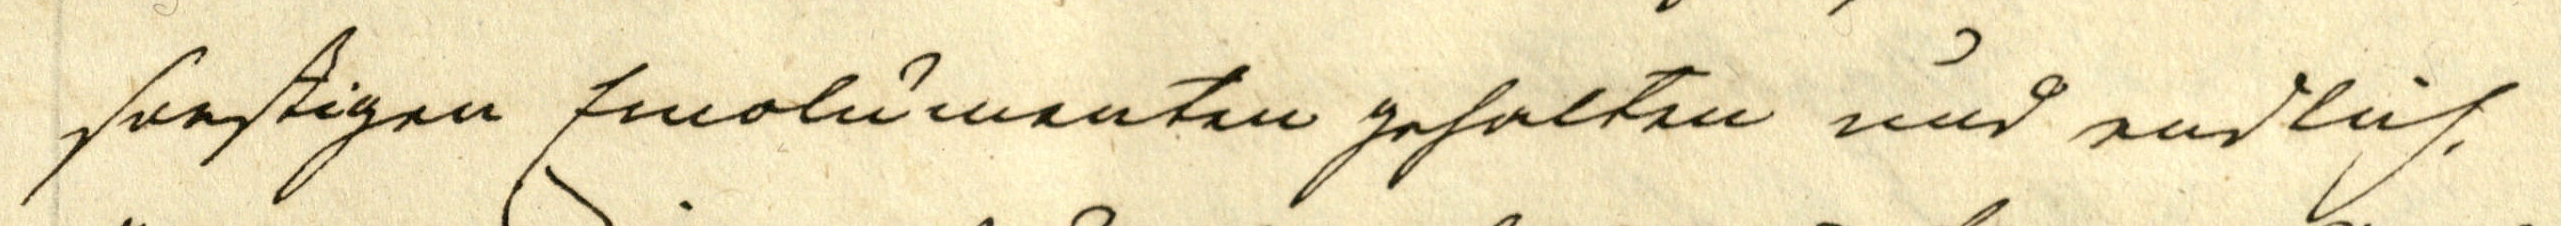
sonstigen Emolumenten gehalten und endlich,
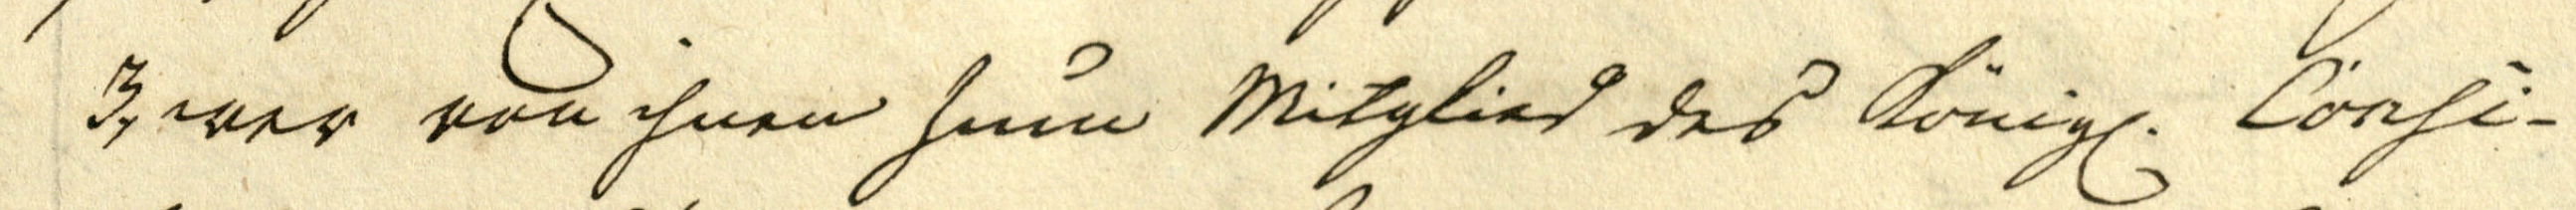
3, wer von ihnen zum Mitglied des Königl. Consi¬
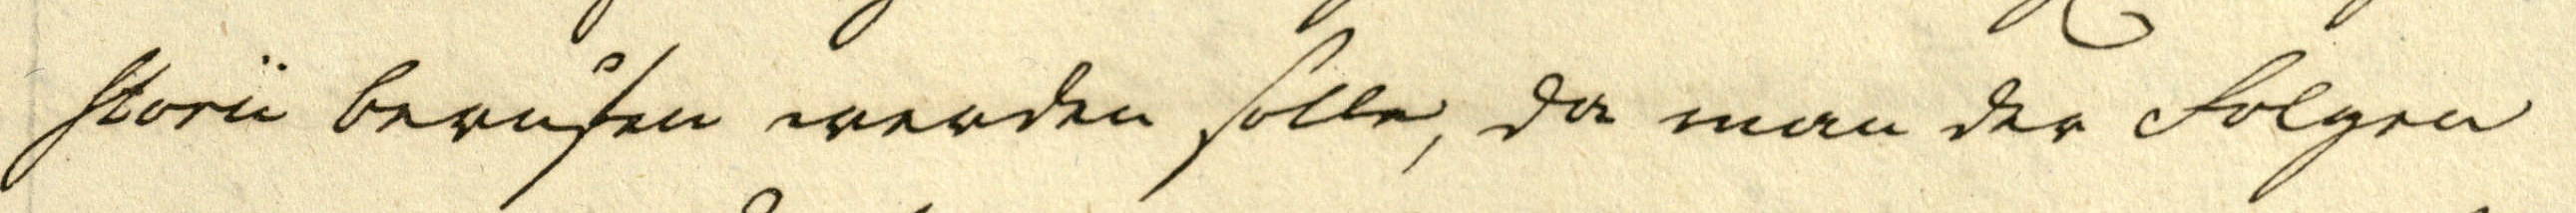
storii berufen werden solle, da man der Folgen
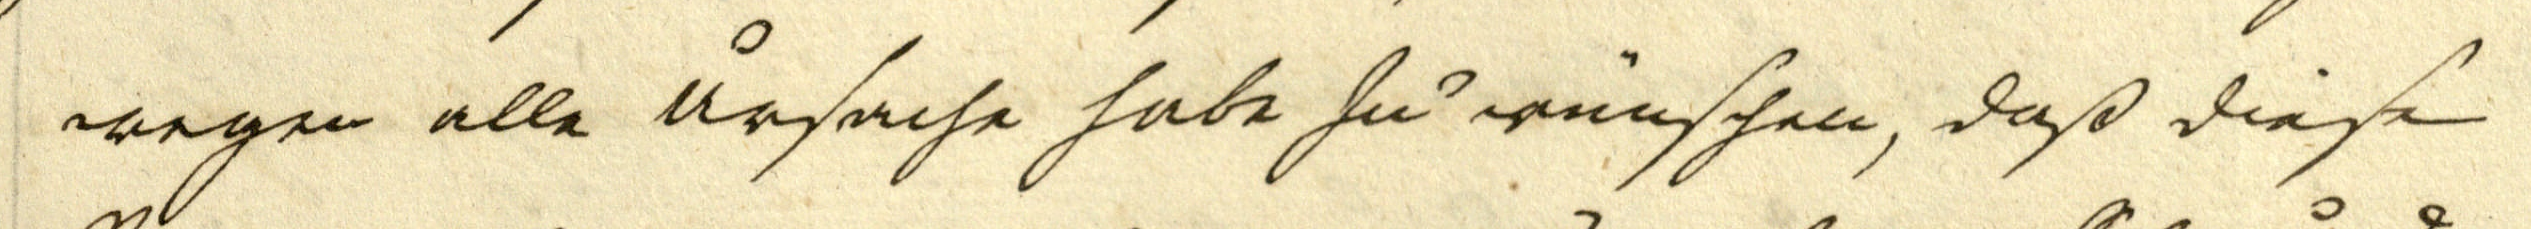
wegen alle Ursache habe zu wünschen, daß diese
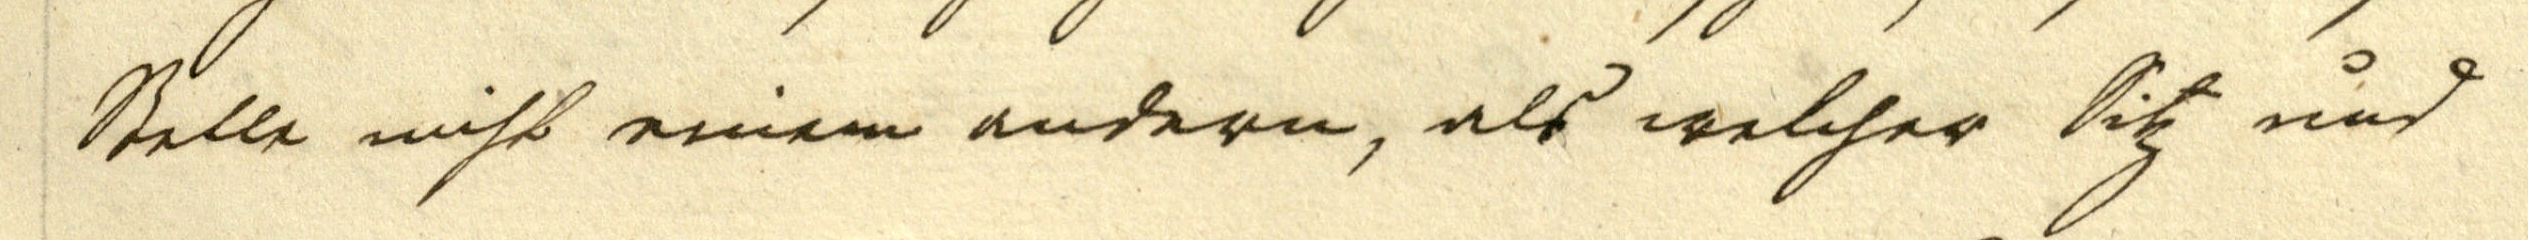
Stelle nicht einem andern, als welcher Sitz und
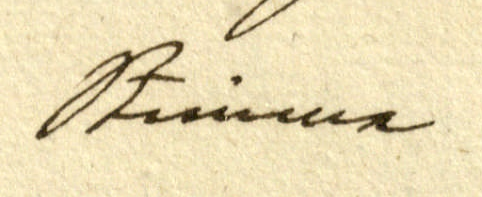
Stimme
